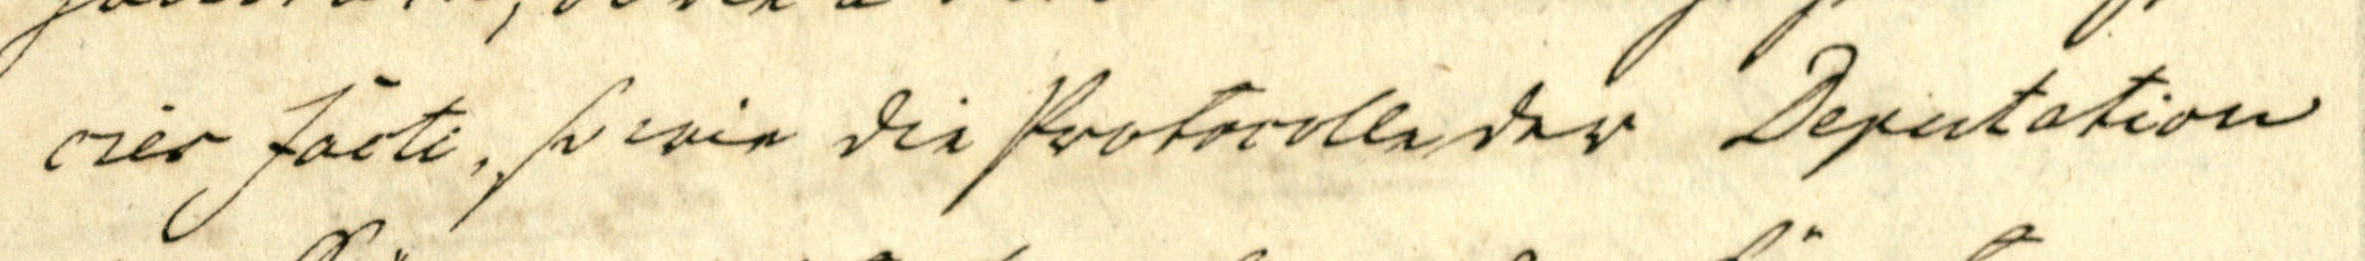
cies facti, so wie die Protocolle der Deputation
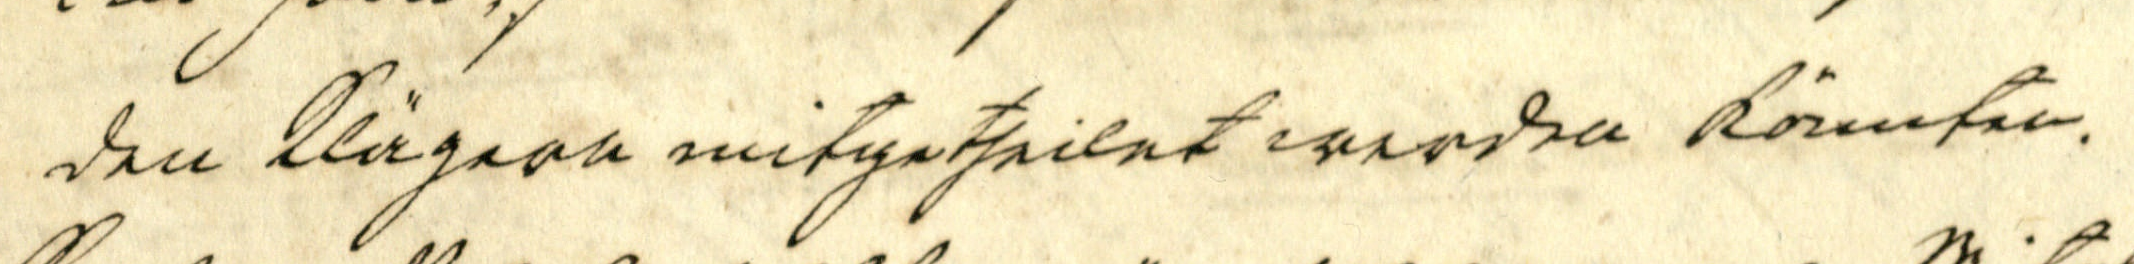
den Klägern mitgetheilet werden könnten.
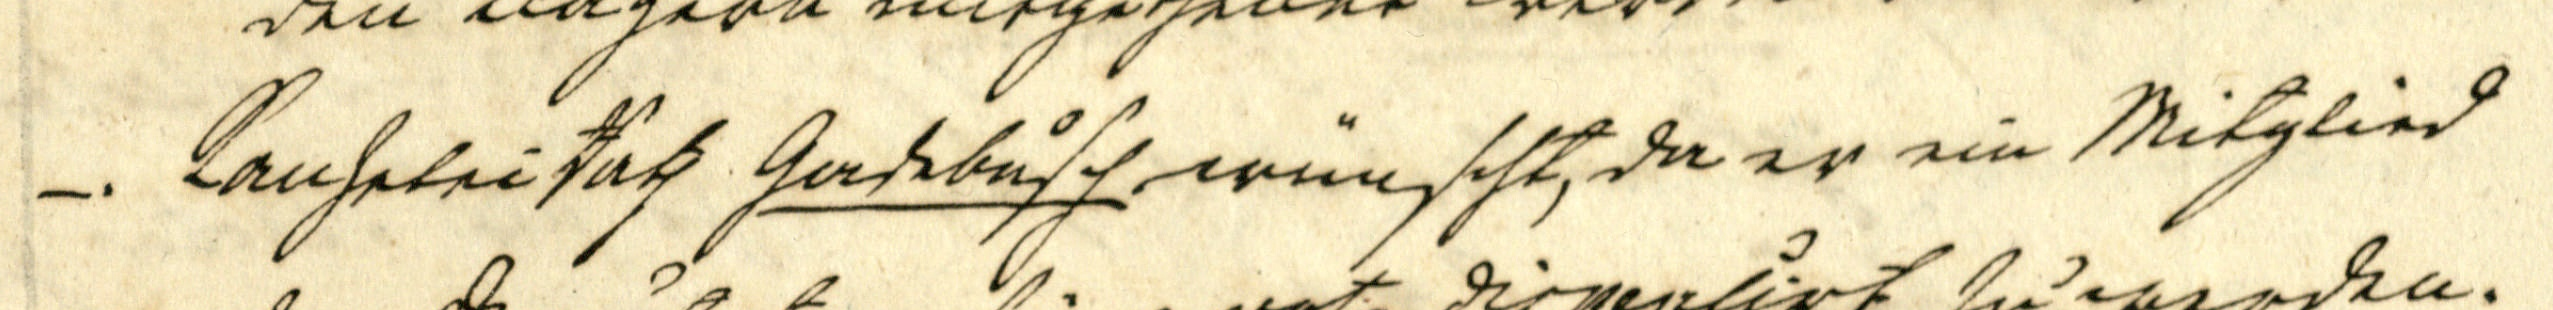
— KanzeleiRath Gadebusch wünscht, da er ein Mitglied
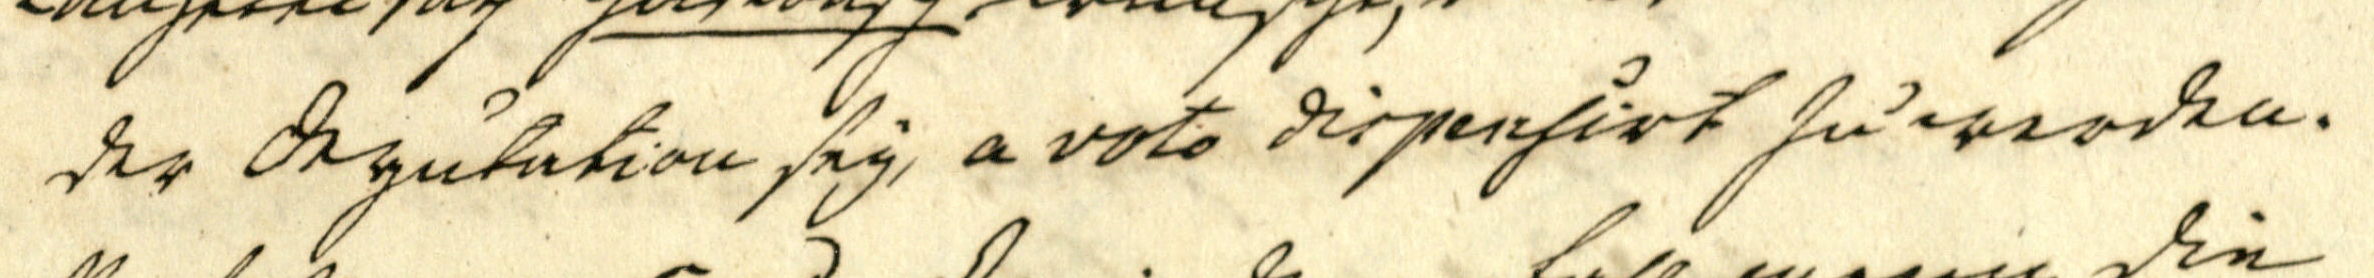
der Deputation seÿ, a voto dispensirt zu werden.
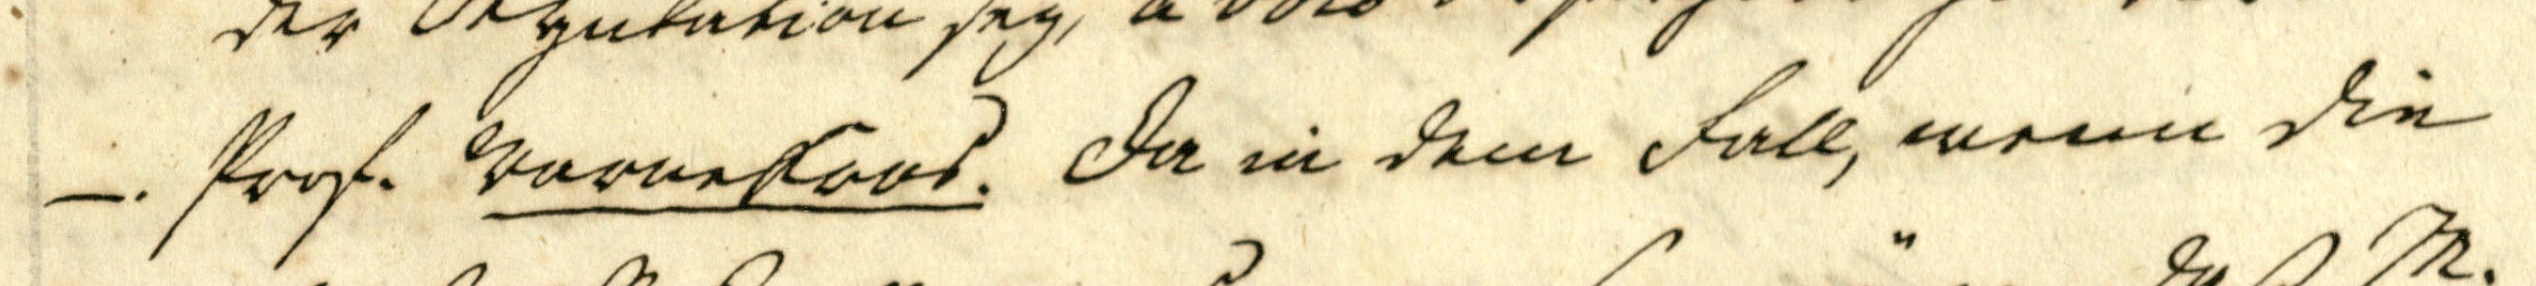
. Prof. Warnekros. Da in dem Fall, wenn die
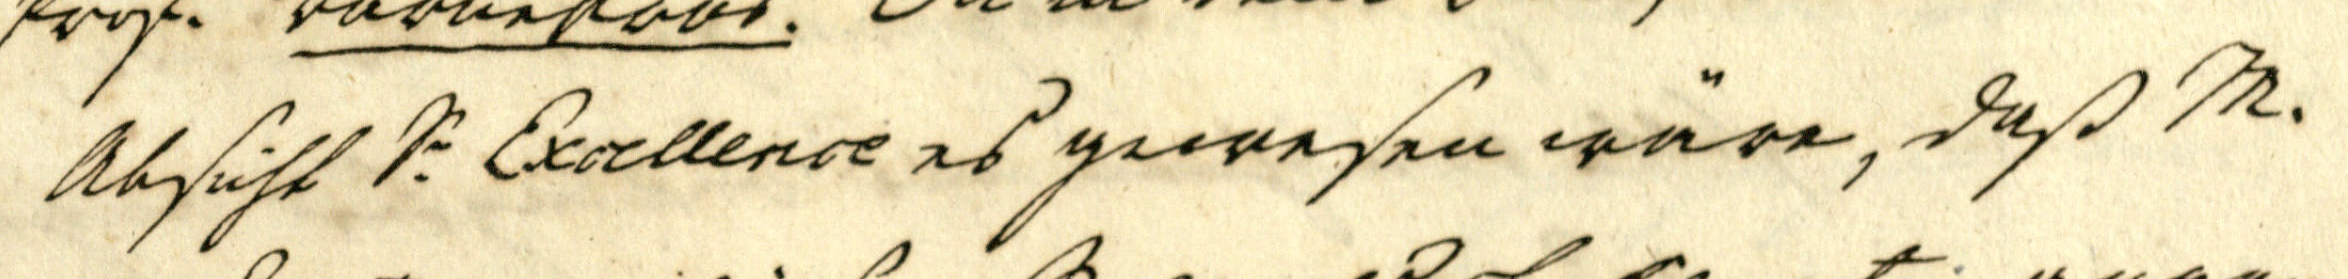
Absicht Sr Excellence es gewesen wäre, daß M.
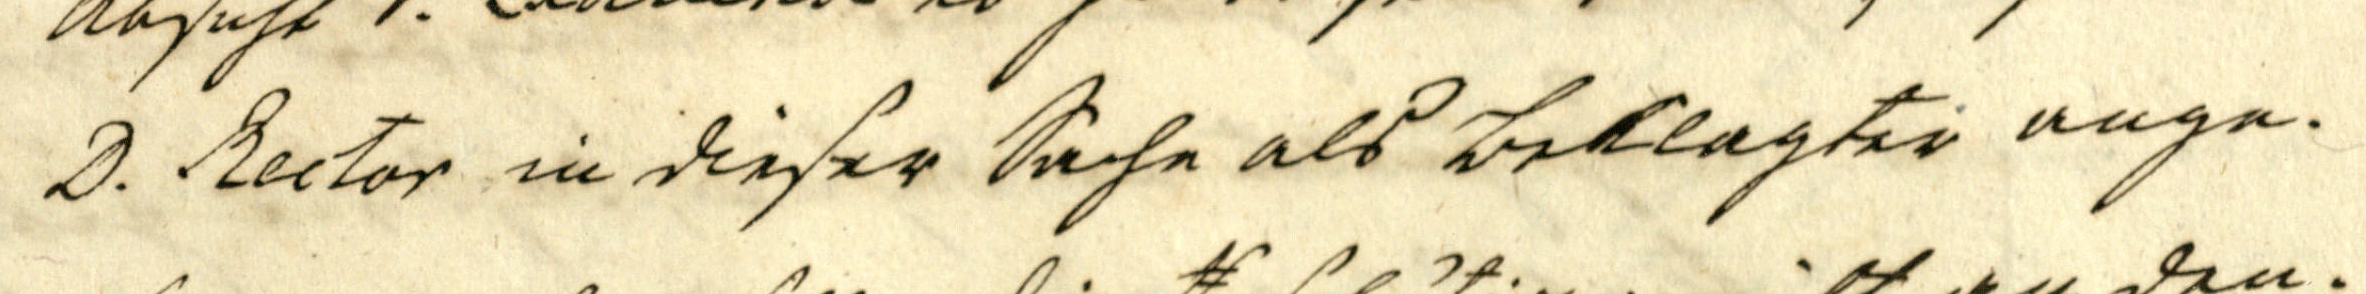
D. Rector in dieser Sache als Beklagter ange¬
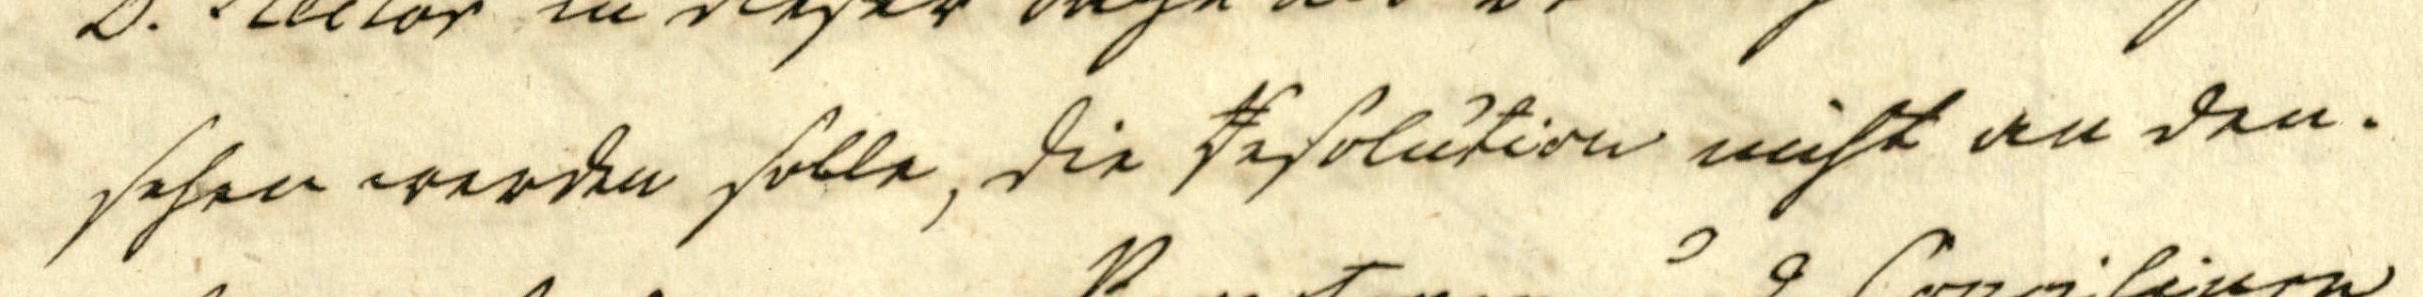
sehen werden solle, die Resolution nicht an den-
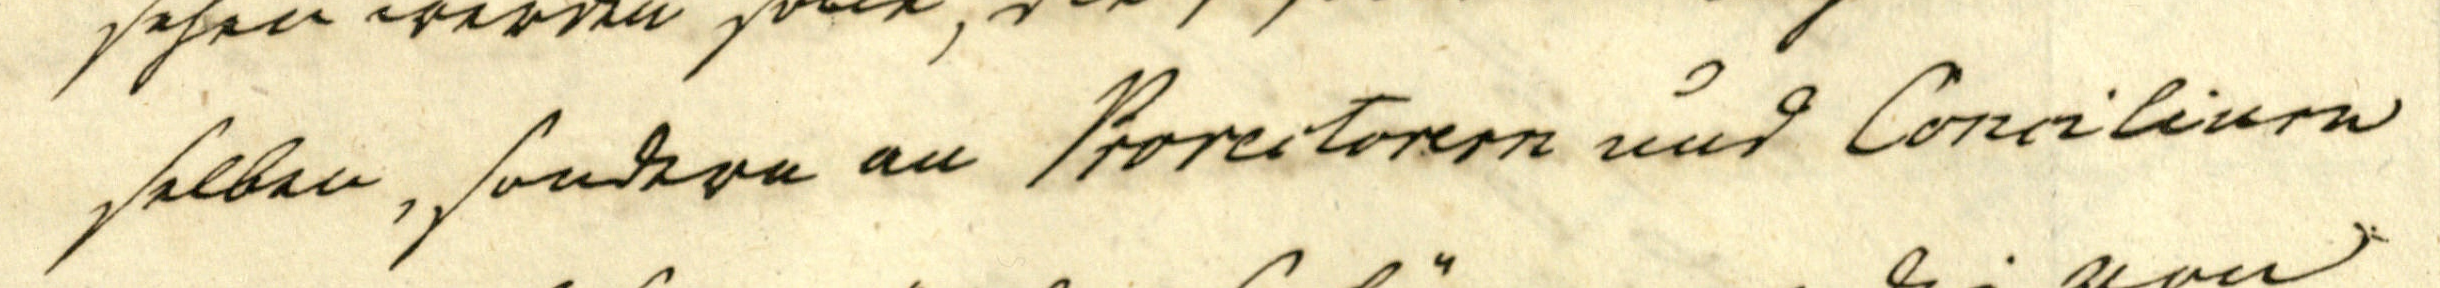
selben, sondern an Prorectorem und Concilium
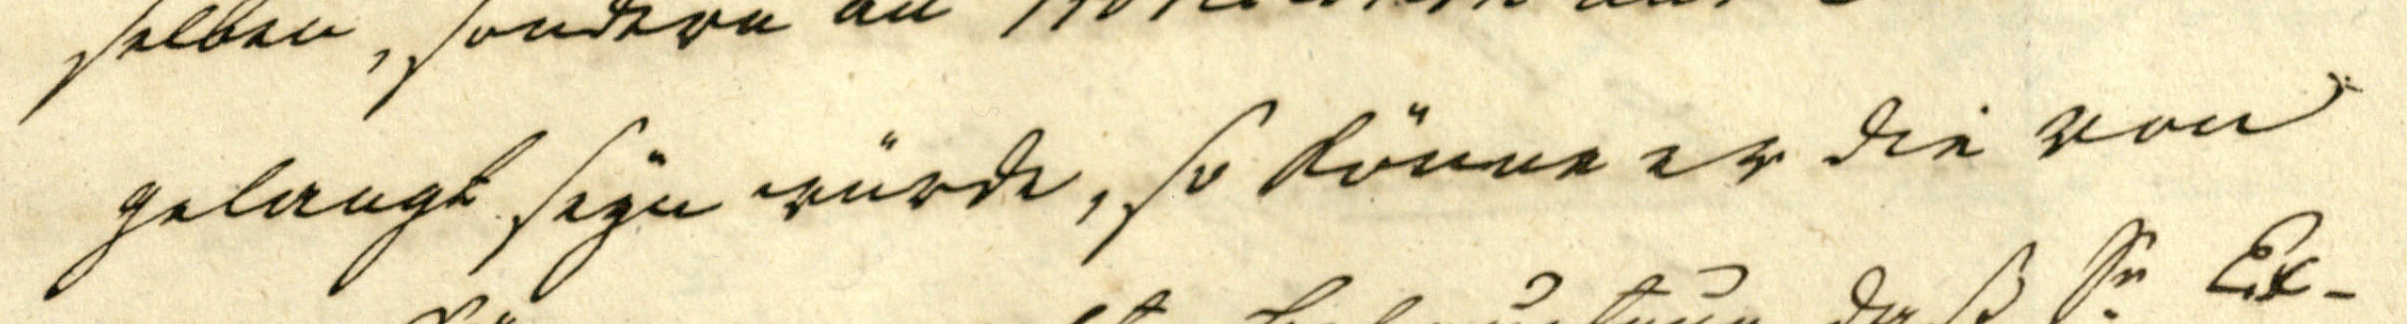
gelangt seÿn würde, so könne er die von
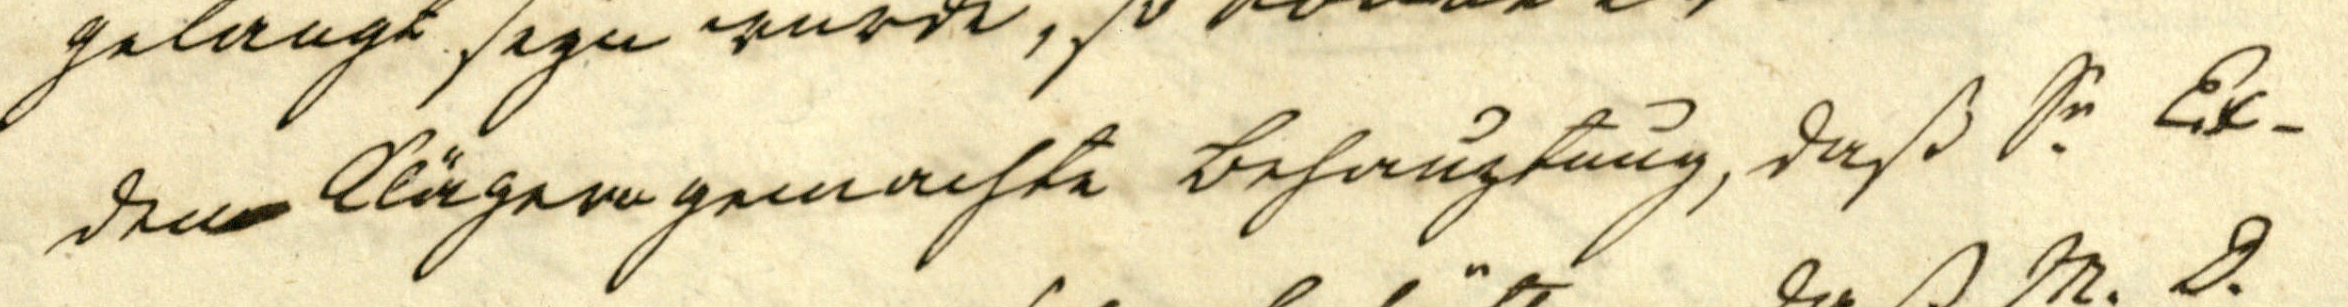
den Klägern gemachte Behauptung, daß Sr. Ex¬
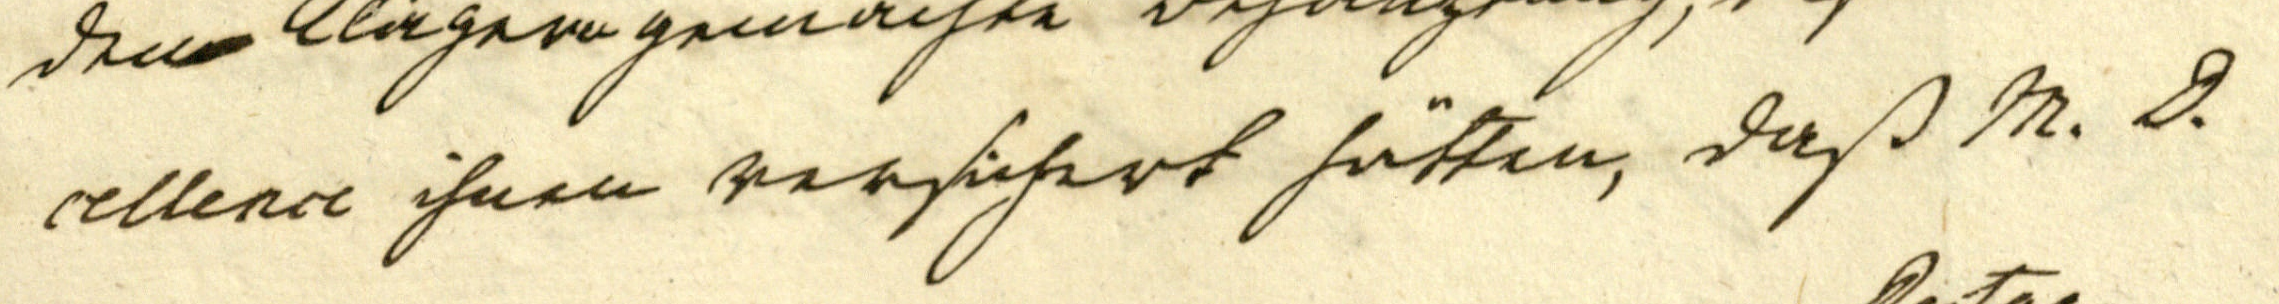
cellence ihnen versichert hätten, daß M. D.
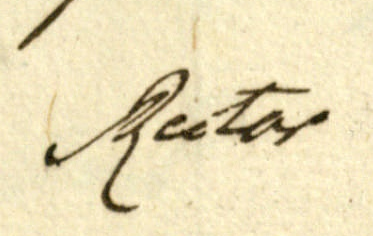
Rector
